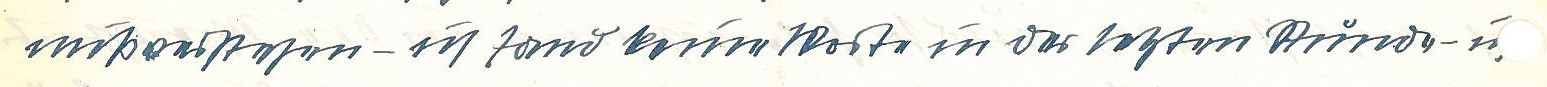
mißverstehen – ich fand keine Worte in der letzten Stunde – u.
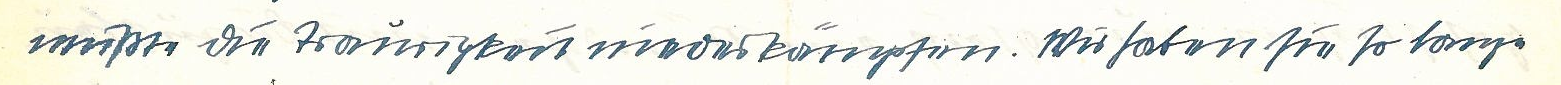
mußte die Traurigkeit niederkämpfen. Wir haben sie so lange
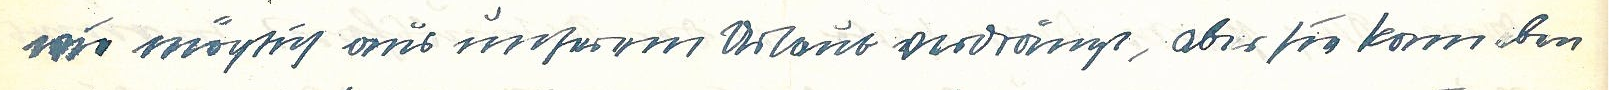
wie möglich aus unserem Urlaub verdrängt, aber sie kam eben
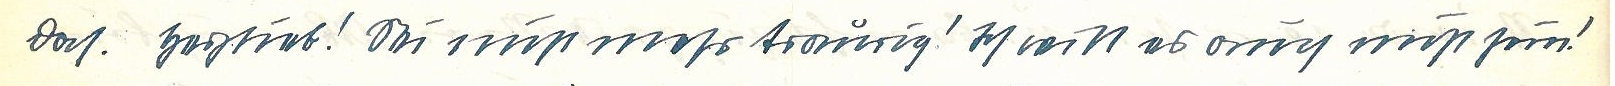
doch. Herzlieb! Sei nicht mehr traurig! Ich will es auch nicht sein!
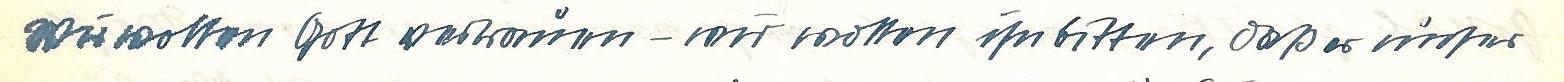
Wir wollen Gott vertrauen – wir wollen ihn bitten, daß er unser
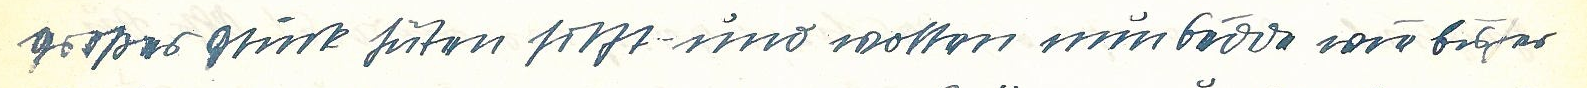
großes Glück hüten hilft – und wollen nun beide wie bisher
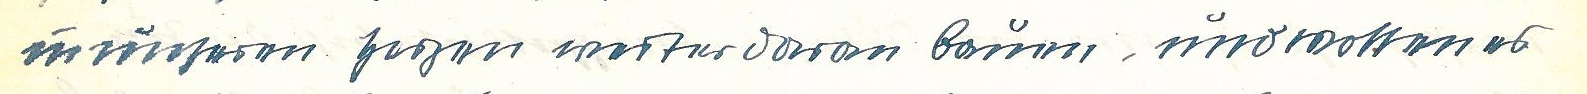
in unseren Herzen weiter daran bauen, und wollen es
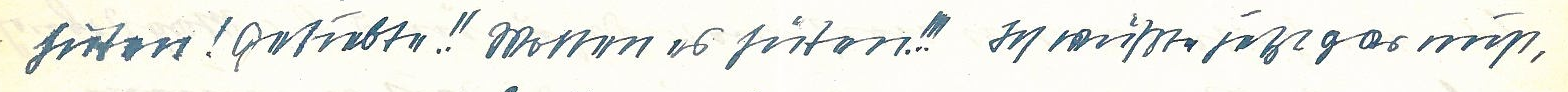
hüten! Geliebte!! Wollen es hüten!!! Ich wüßte jetzt gar nicht,
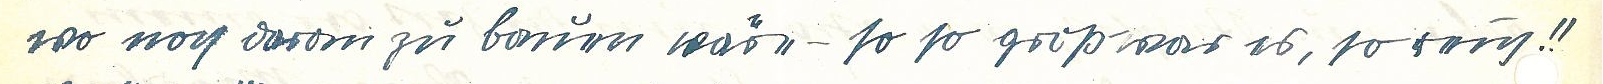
wo noch daran zu bauen wäre – so so groß – war es, so reich!!
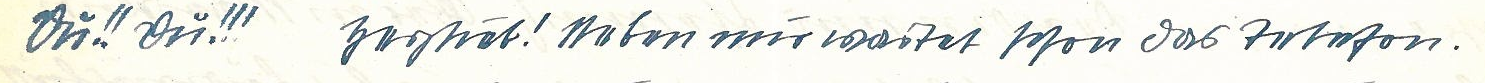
Du!! Du!! Herzlieb! Neben mir wartet schon das Telefon.
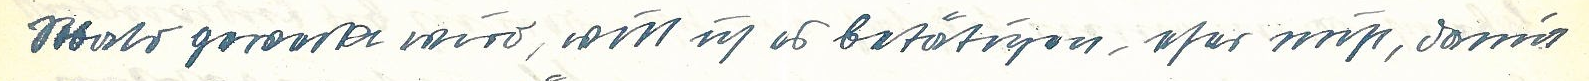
Sobald geweckt wird, will ich es betätigen, eher nicht, damit
